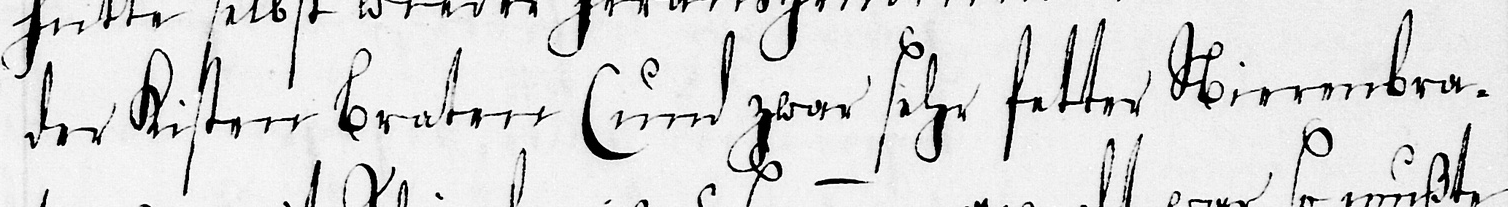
der Kisten Braten (und zwar sehr fetter Nierenbra¬
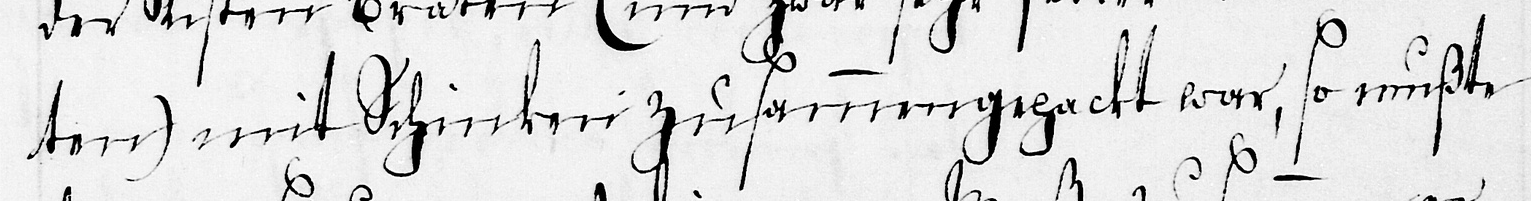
ten) mit Schinken zusammengepackt war, so mußte
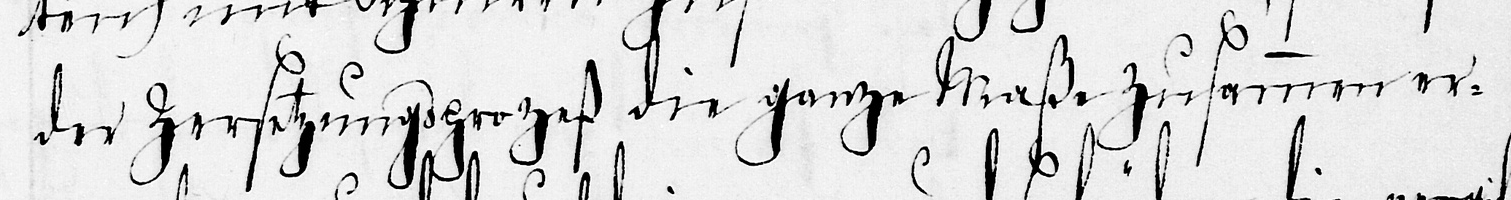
der Zersetzungsprozeß die ganze Maße zusammen er¬
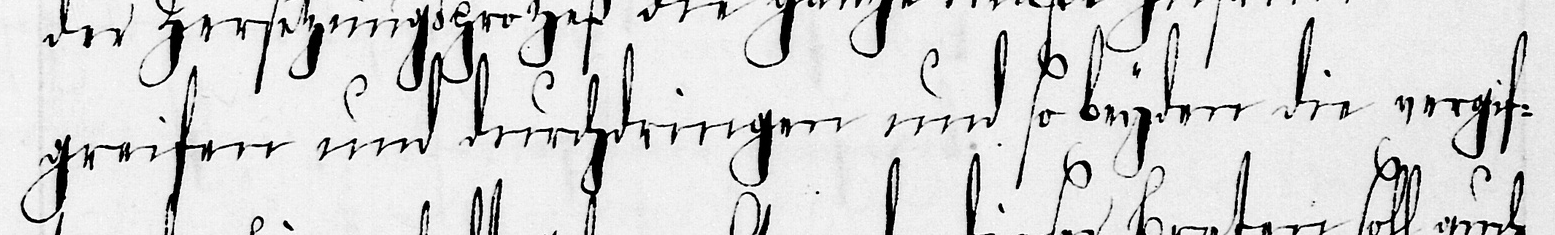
greifen und durchdringen und so beyden die vergif¬
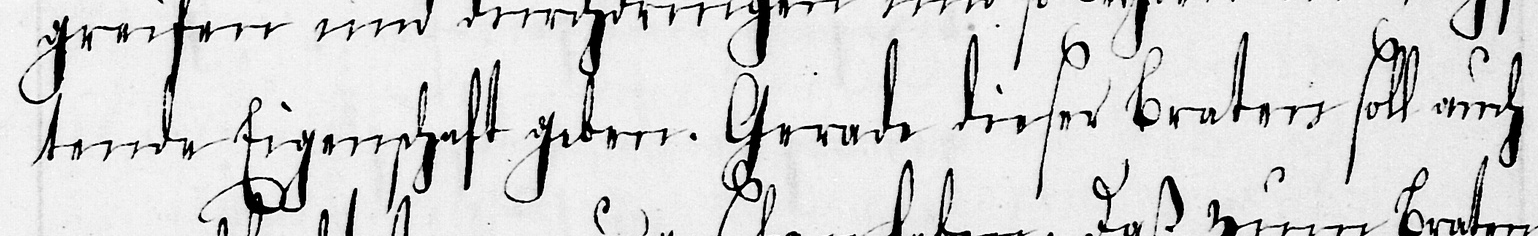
tende Eigenschaft geben. Gerade dieser Braten soll au¬
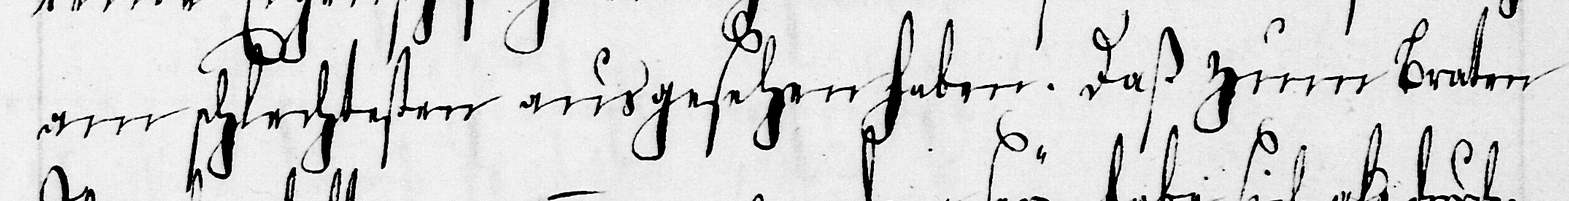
am schlechtesten ausgesehen haben. Daß zum Braten
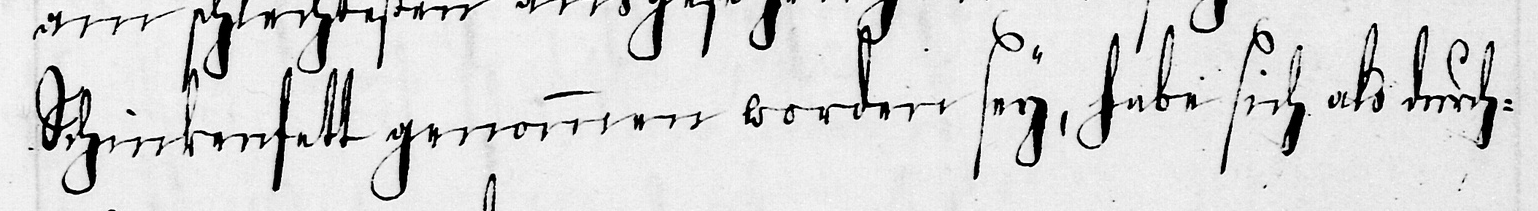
Schinkenfett genommen worden sey, habe sich als durc¬
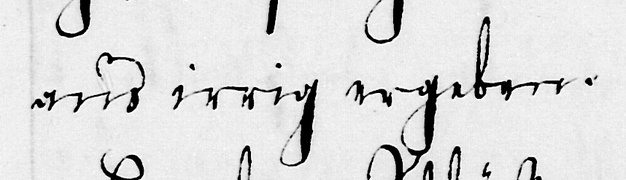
haus irrig ergeben.
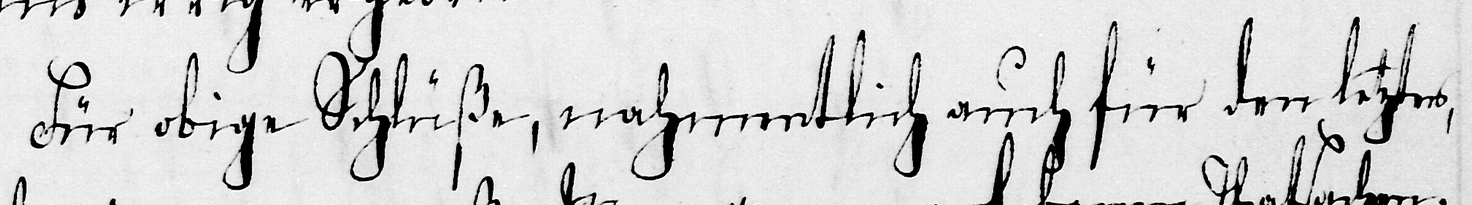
Für obige Schlüße, nahmentlich auch für den letzte¬
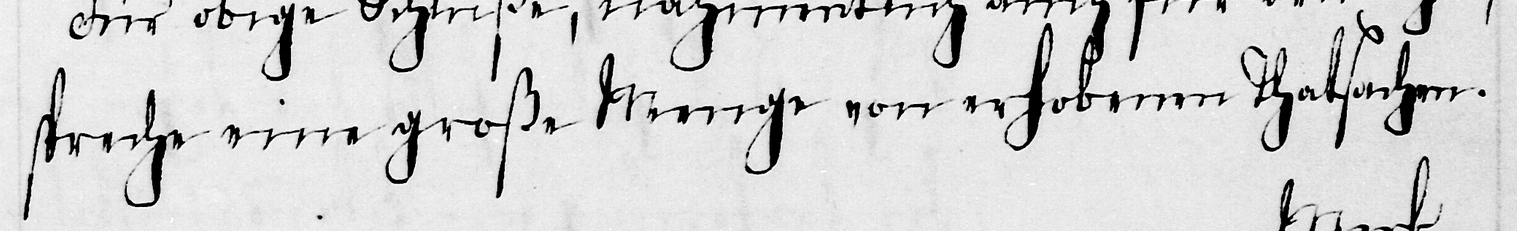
spreche eine große Menge von erhobenen Thatsachen.
